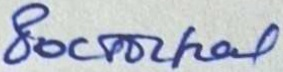восточная
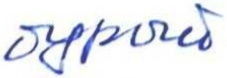бурый
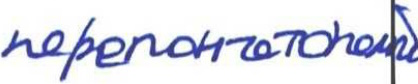перепончатополый
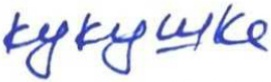кукушка
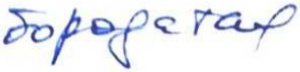бородатая
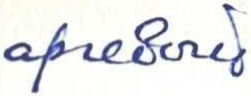арчевый
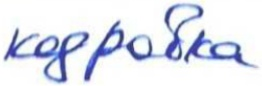кодровка
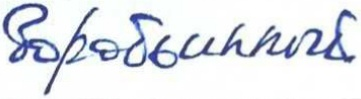воробьинный
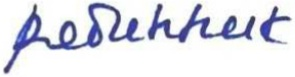рябинник
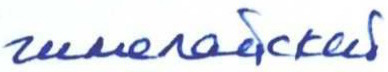гимелайскей
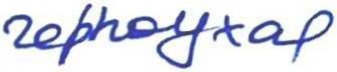черноухая
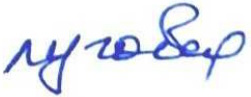луговая
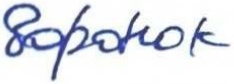воронок
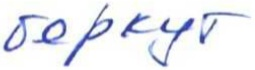беркут
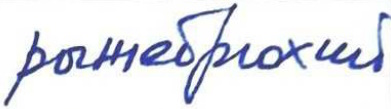рыжебрюхий
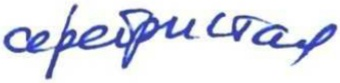серебристая
